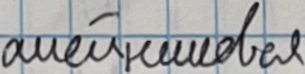ошейниковая
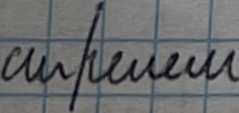стрепет
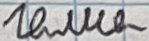галка
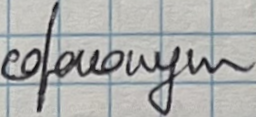сорокопут
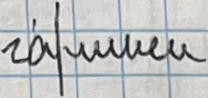гаршнеп
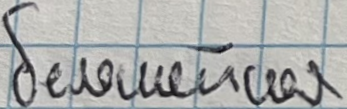белошейная
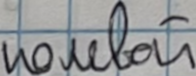полевой
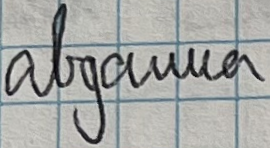авдотка
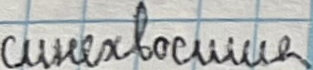синехвостка
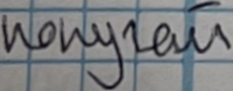попугай
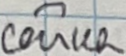сойка
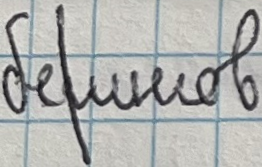берингов
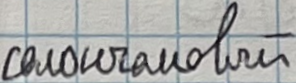солончаковый
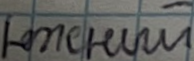южный
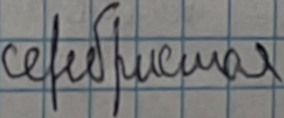серебристая
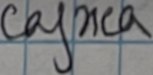саджа
